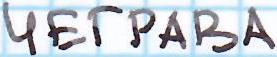чеграва
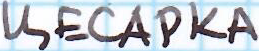цесарка
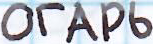огарь
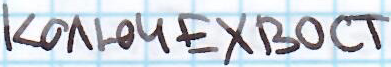колючехвост
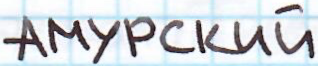амурский
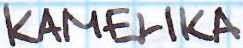каменка
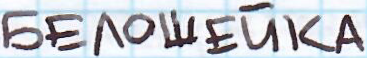белошейка
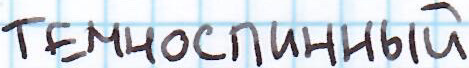темноспинный
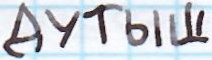дутыш
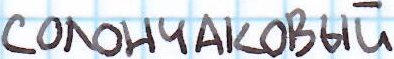солончаковый
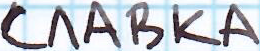славка
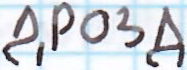дрозд
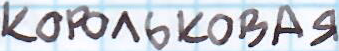корольковая
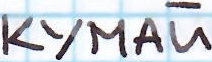кумай
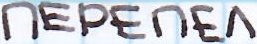перепел
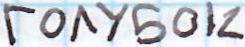голубок
